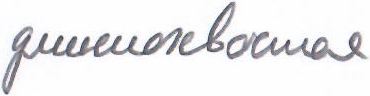длиннохвостая
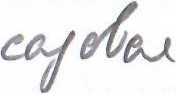садовая
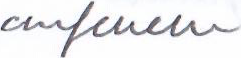стрепет
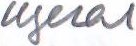щегол
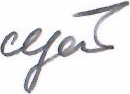седой
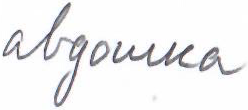авдотка
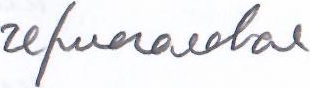черноголовая
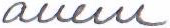аист
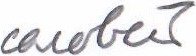соловей
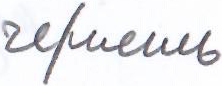чернеть
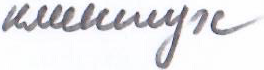клинтух
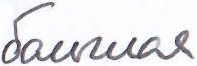большая
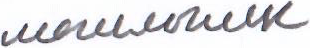могильник
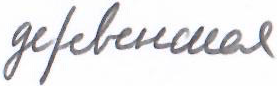деревенская
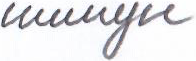шипун
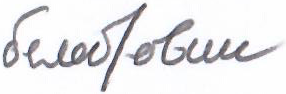белобровик
